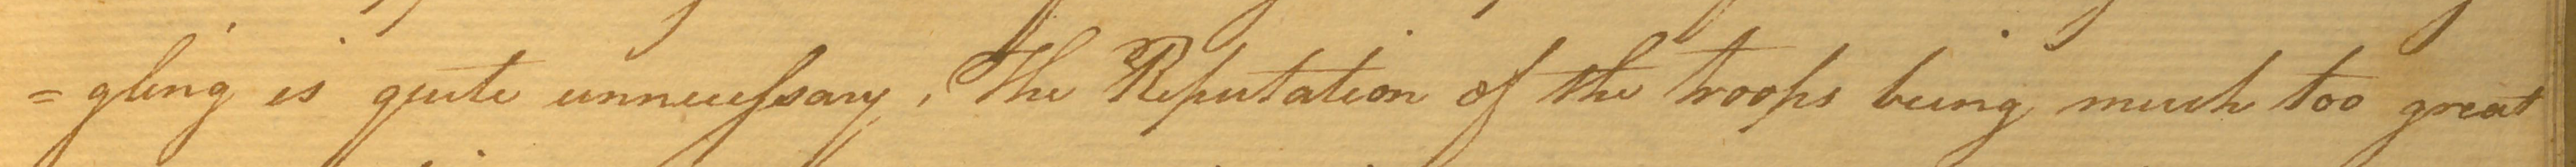-gling is quite unnecessary, The Reputation of the troops being much too great
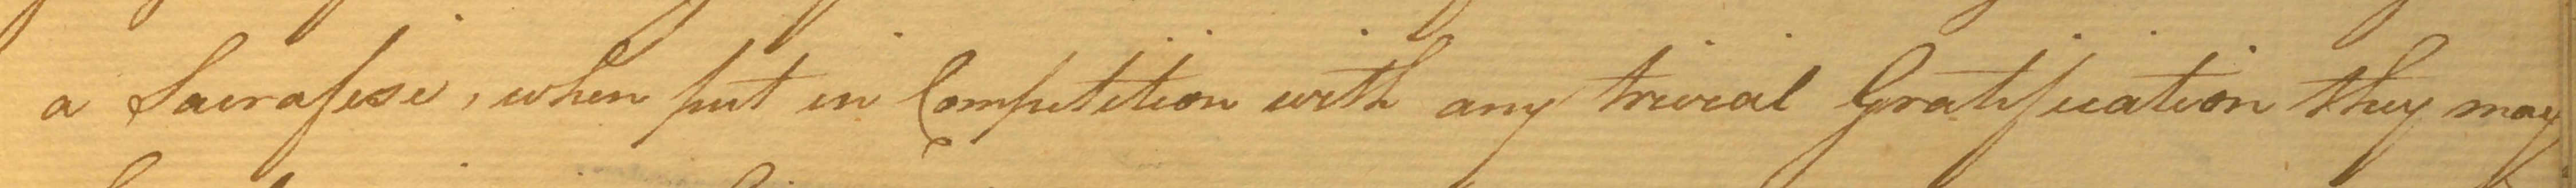a Sacrafise, when put in Competition with any trivial Gratification they may
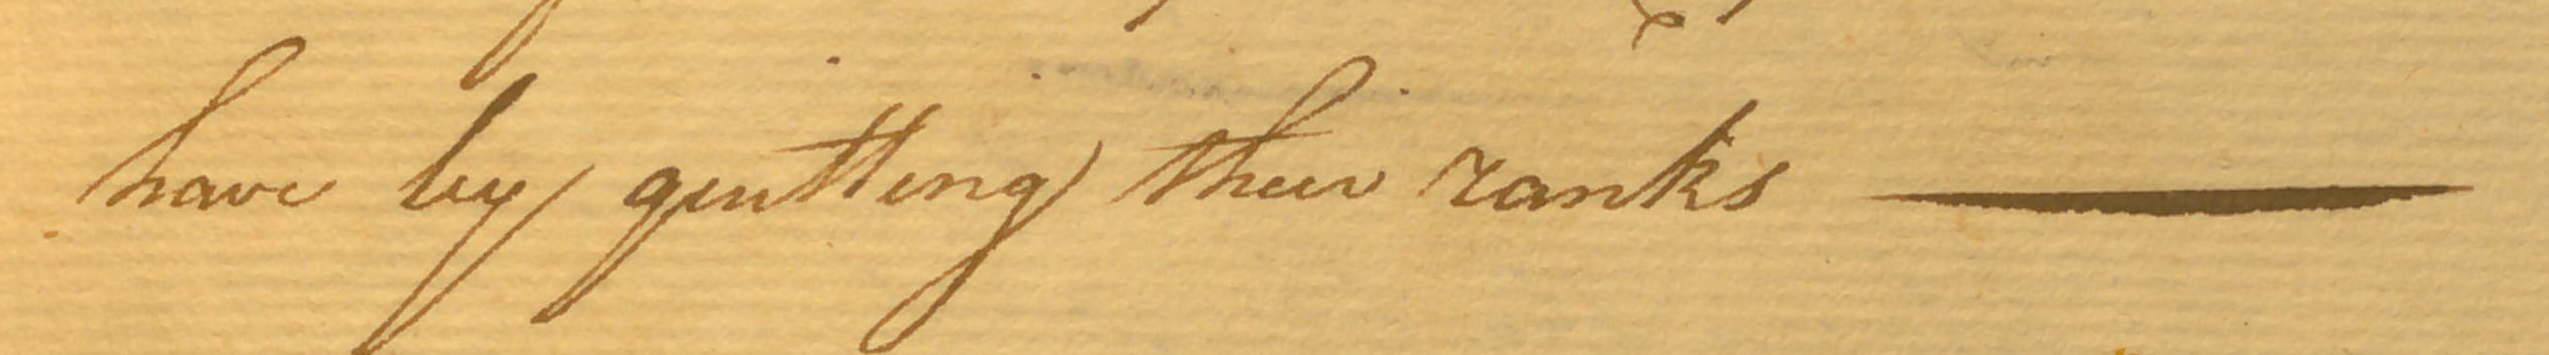have by quitting their ranks-
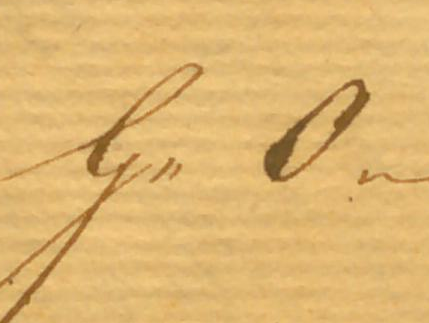G.O-
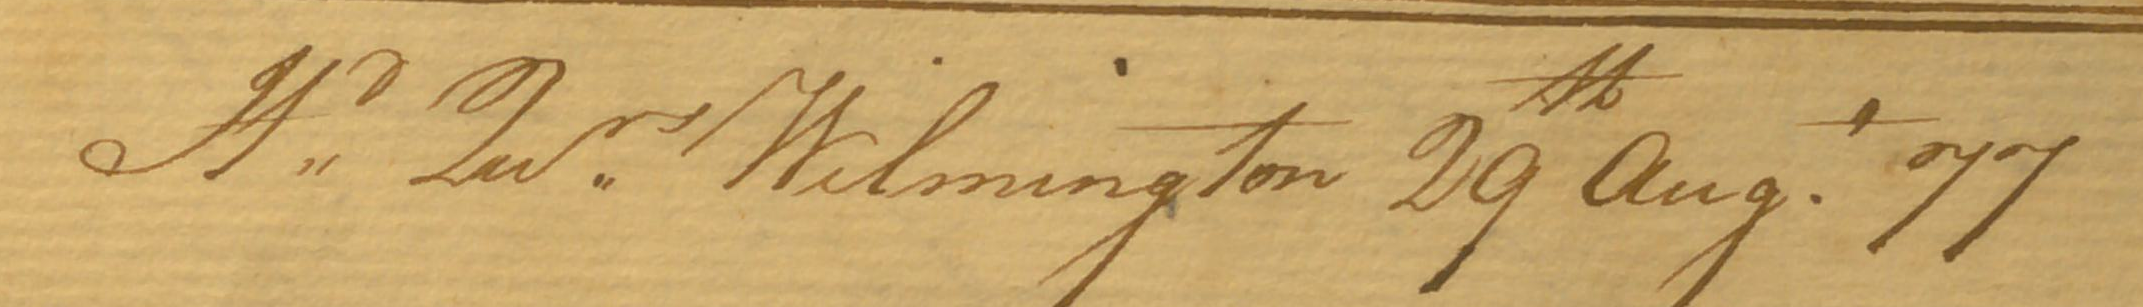H^d. Qu^rs. Wilmington 29^th Aug^t. 77
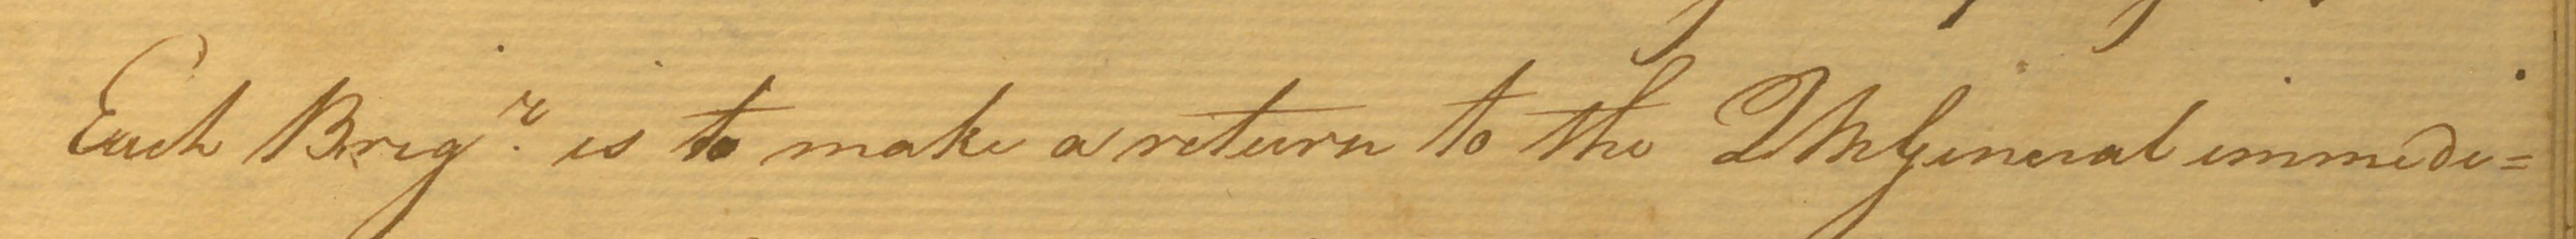Each Brig^r. is to make a return to the Q M General immedi-
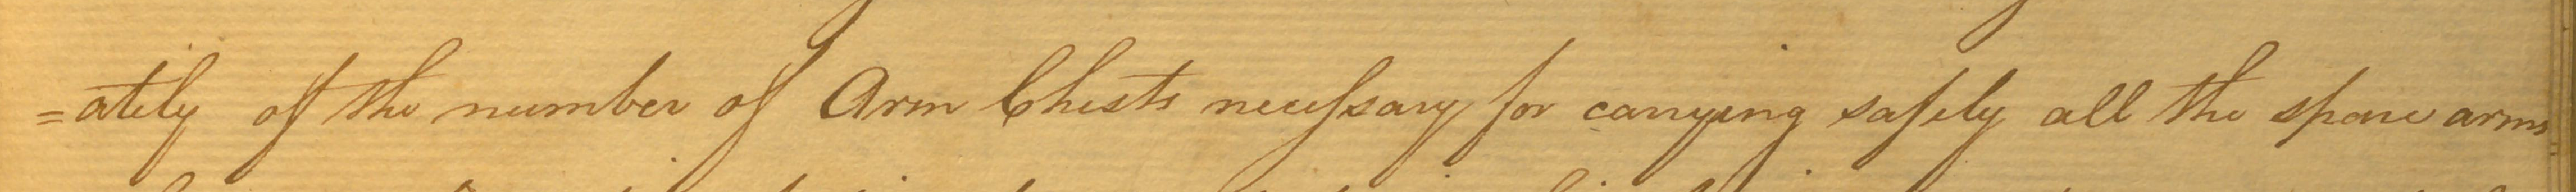-ately of the number of Arm Chests necessary for carrying safely all the spare arms
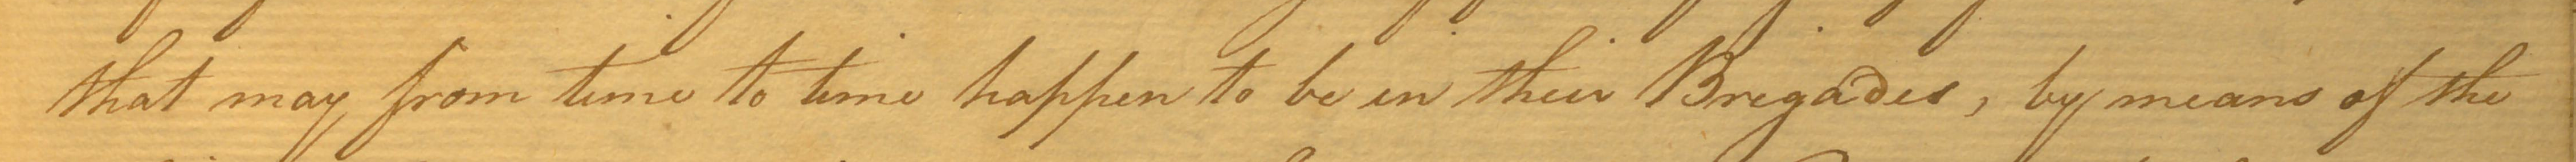that may from time to time happen to be in their Brigades, by means of the
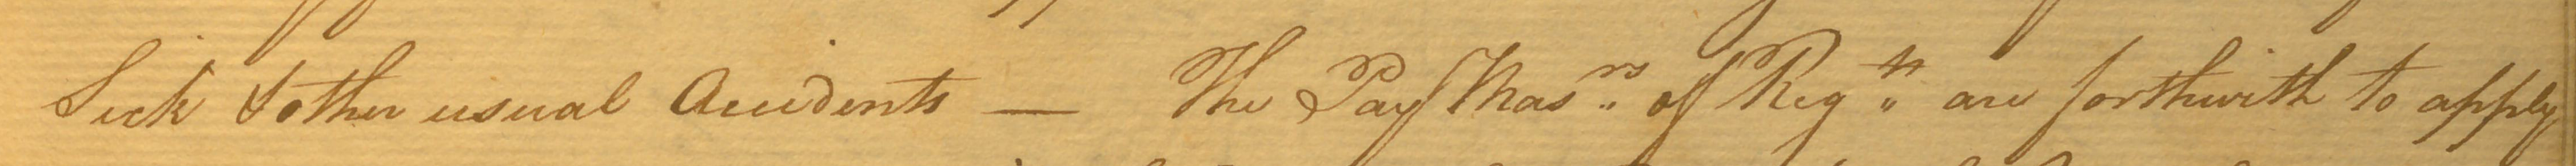Sick to their usual Accidents- The pay mas^rs. of Reg^ts. are forthwith to apply
